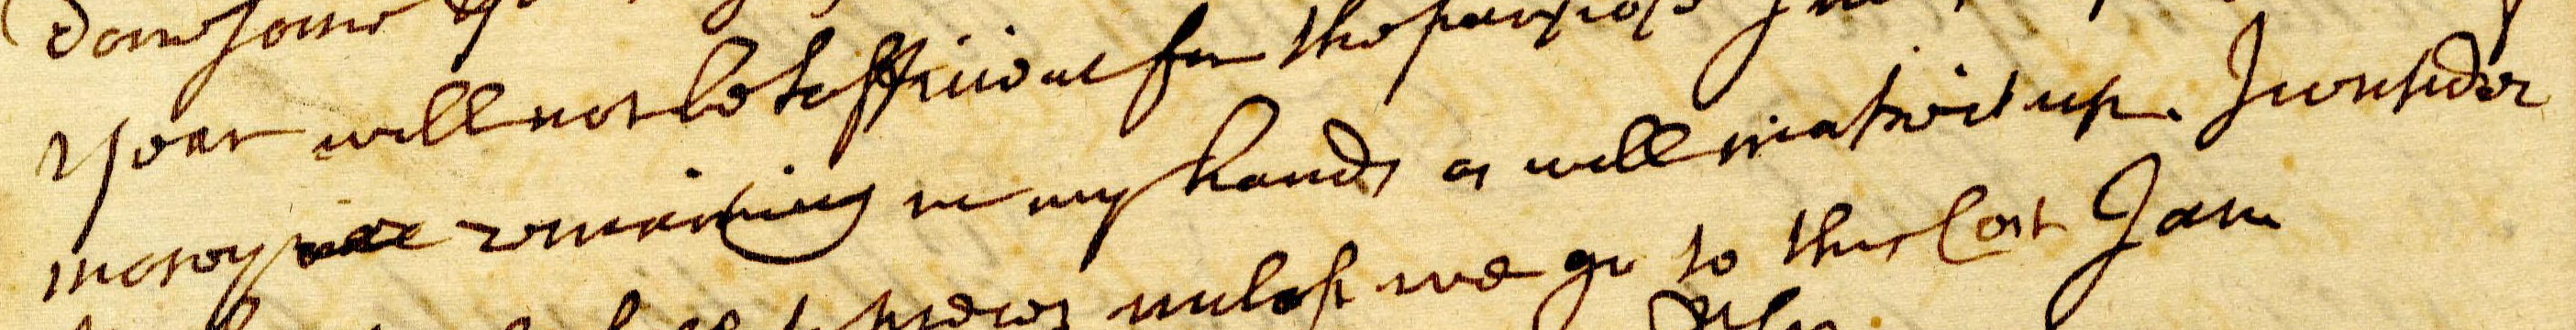money [__] remaining my hands as well make it up. I consider
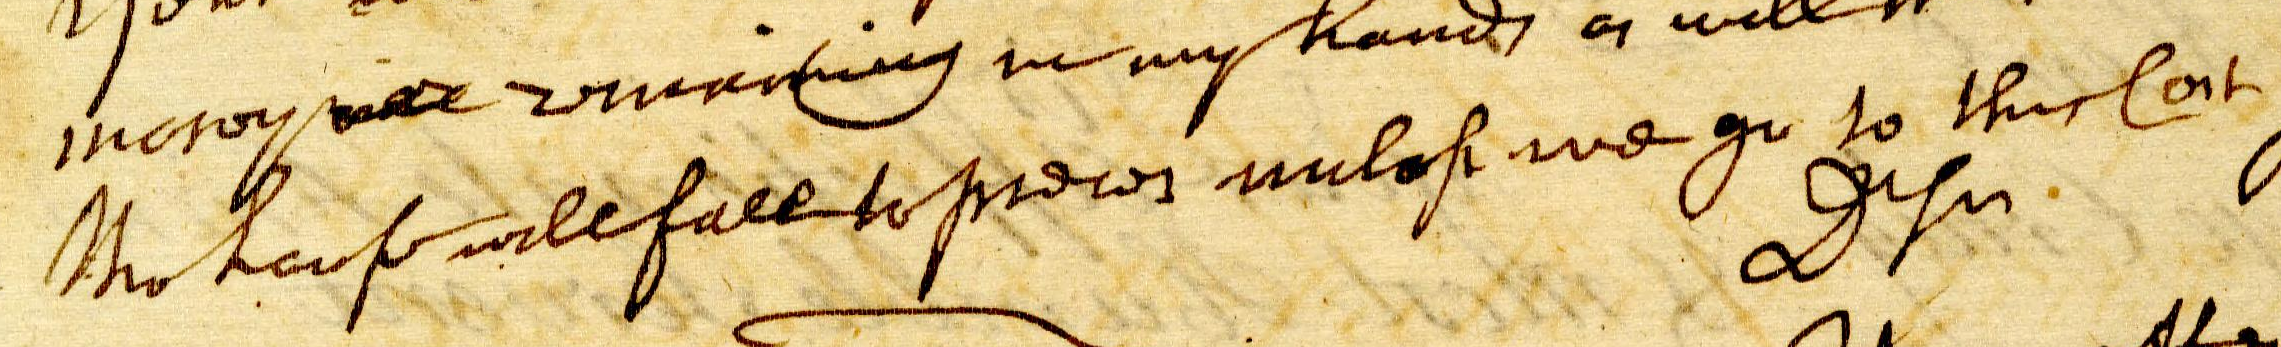the house will fall to pieces unless we go to this Cost
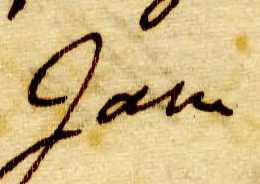I am
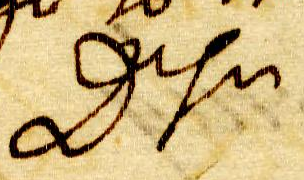D^r S^r
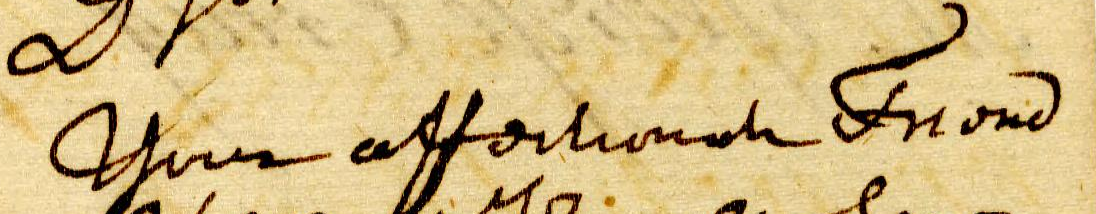Your affectionate Friend
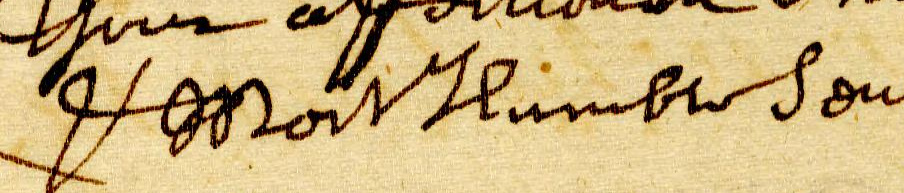& Most Humble Se^rv
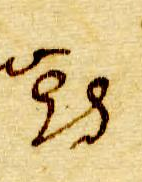ES
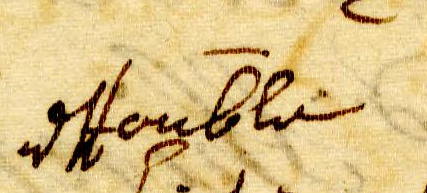y^e Honble
